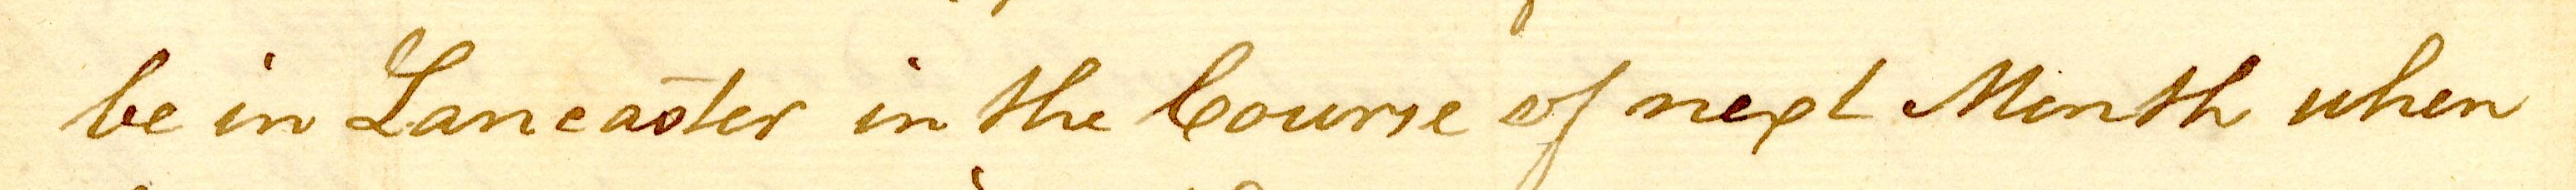be in Lancaster in the Course of next Month when
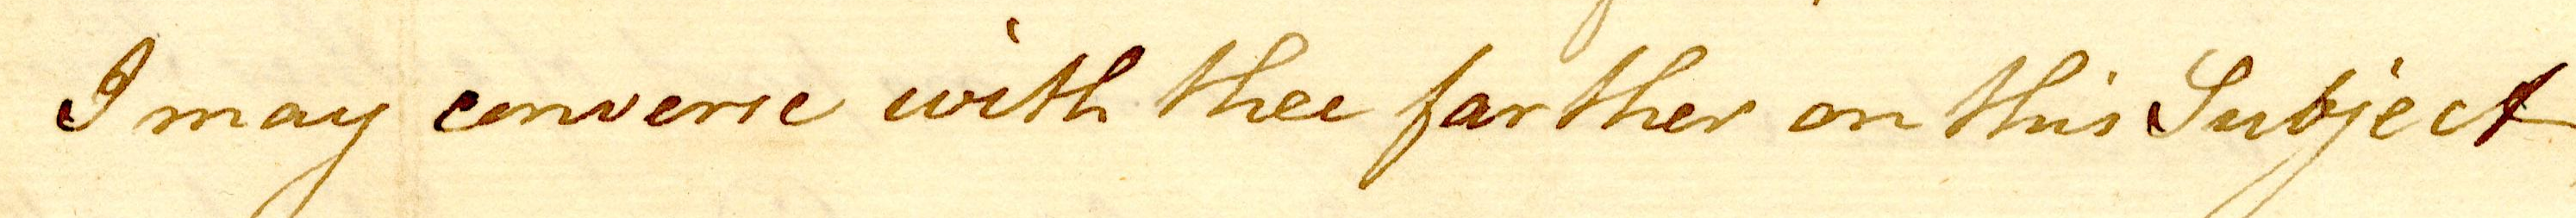I may converse with thee farther on this Subject
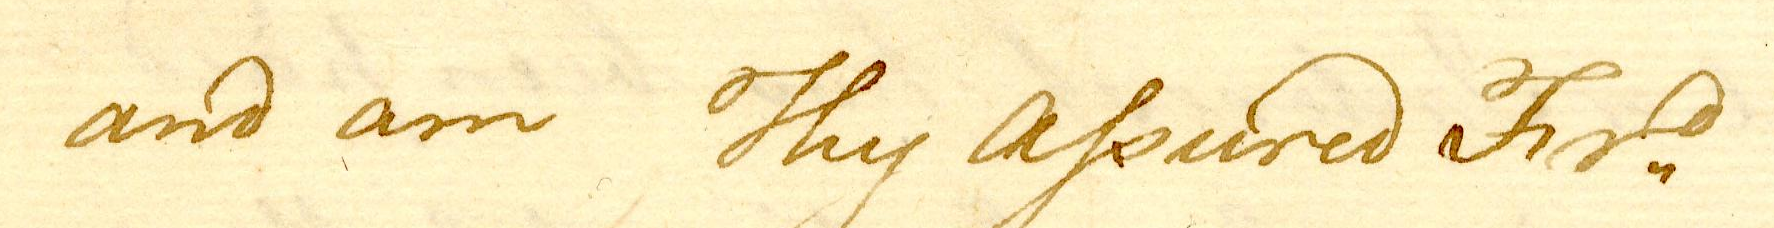and am Thy assured Fr'd
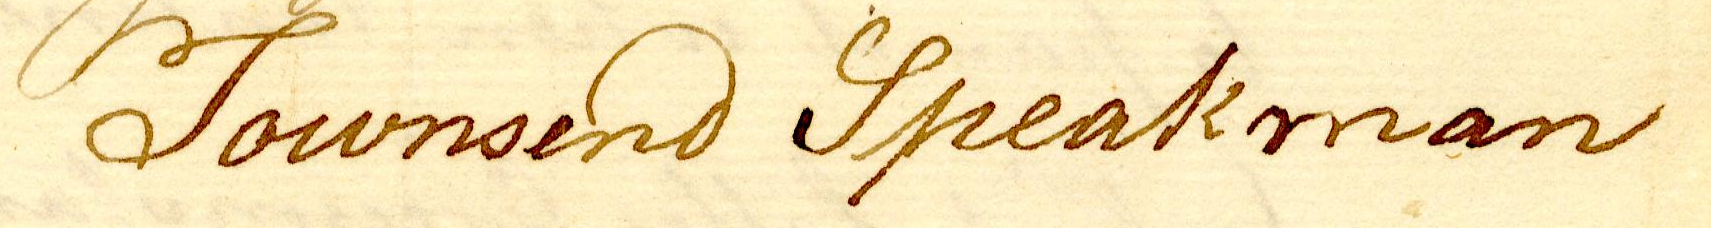Townsend Speakman
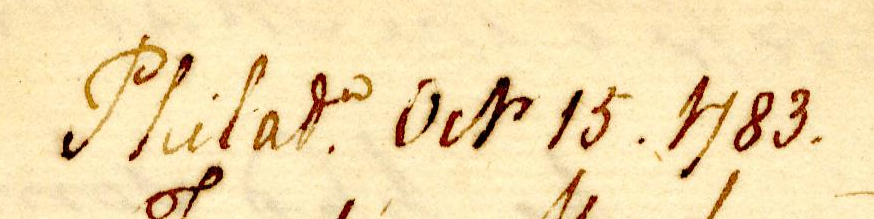Philad^a. Oct^r 15. 1783.
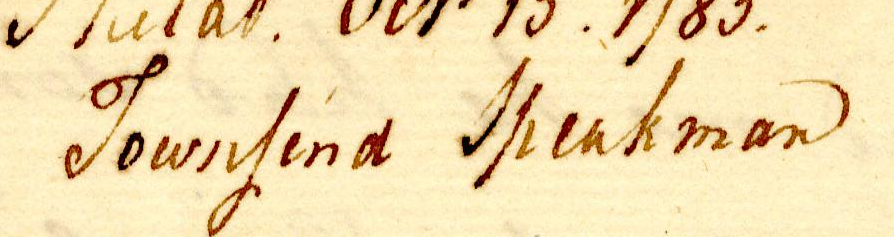Townsend Speakman
